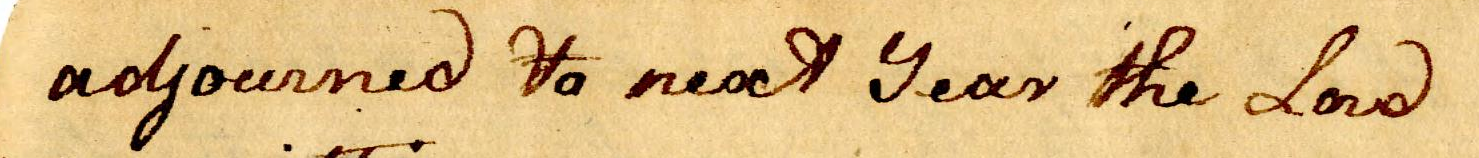adjourned to next Year the Lord
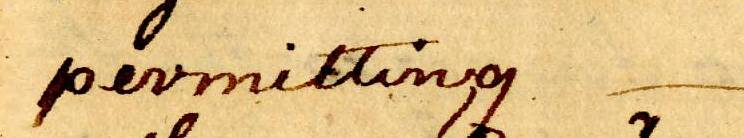permitting-
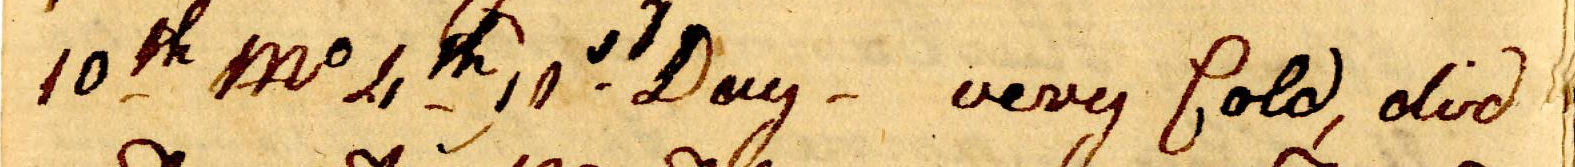10^th M^o 4^th) 1^st Day- very Cold, did
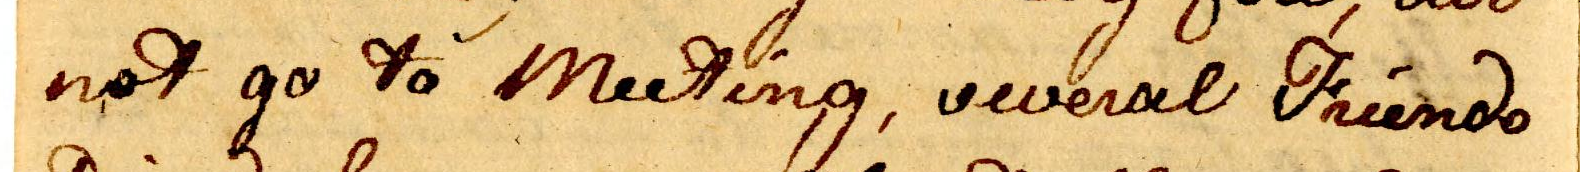not go to Meeting, several Friends
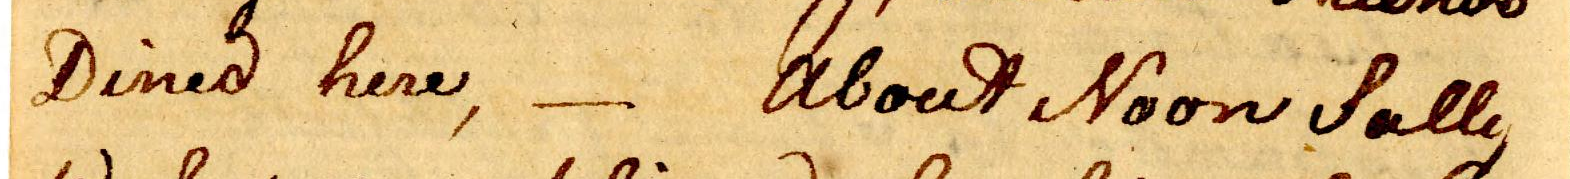Dined here,- About Noon Sally
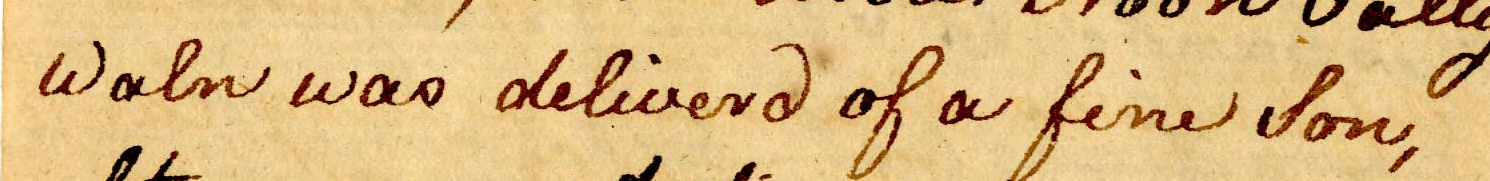Waln was deliverd of a fine Son,
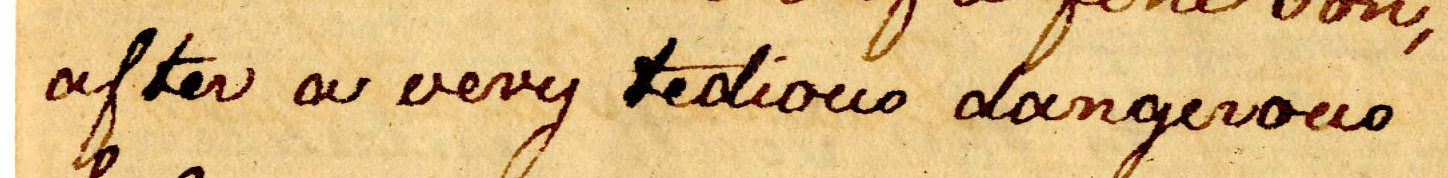after a very tedious dangerous
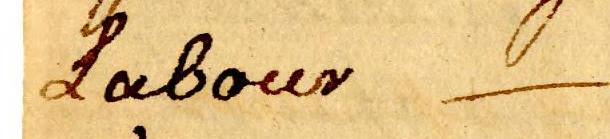Labour-
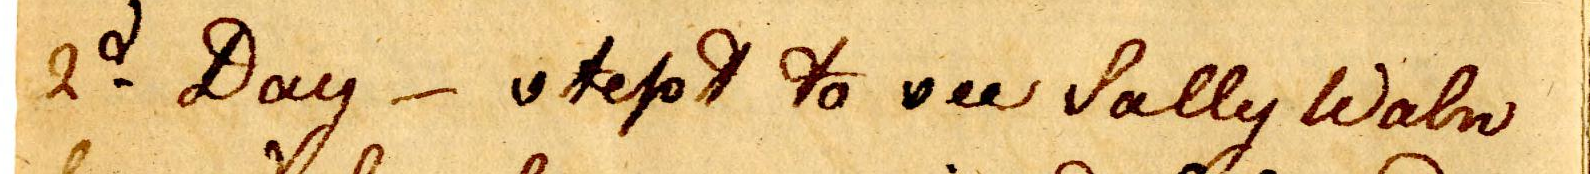2^d Day- stept to see Sally Waln
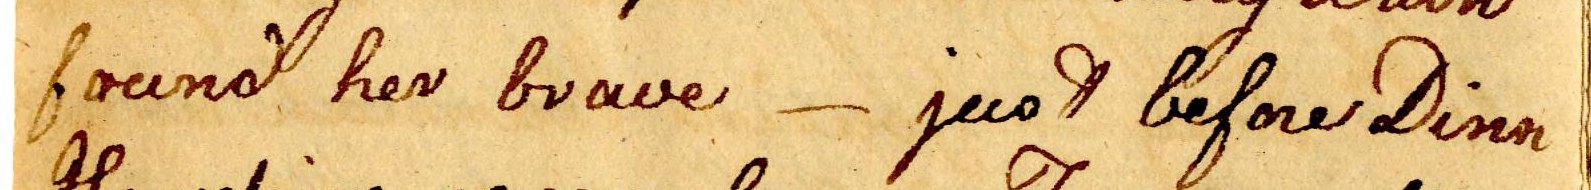found her brave- just before Dinn
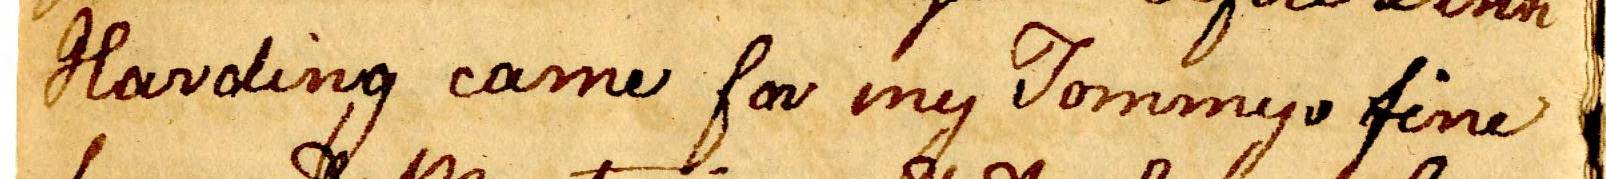Harding came for my Tommys fine
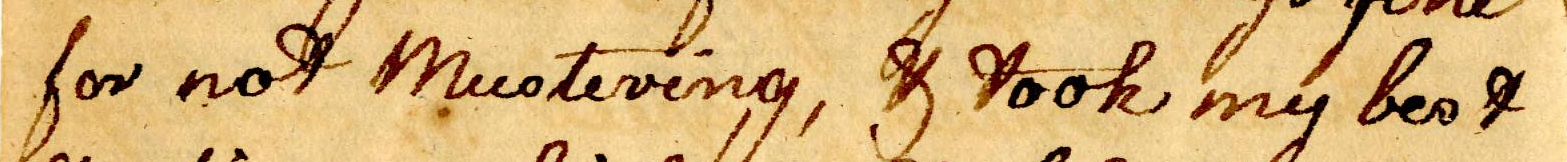for not Mustering, & took my best
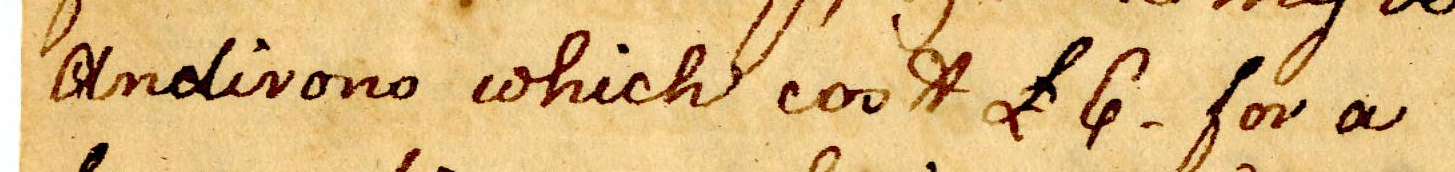Andirons which cost 6 sterlings- for a
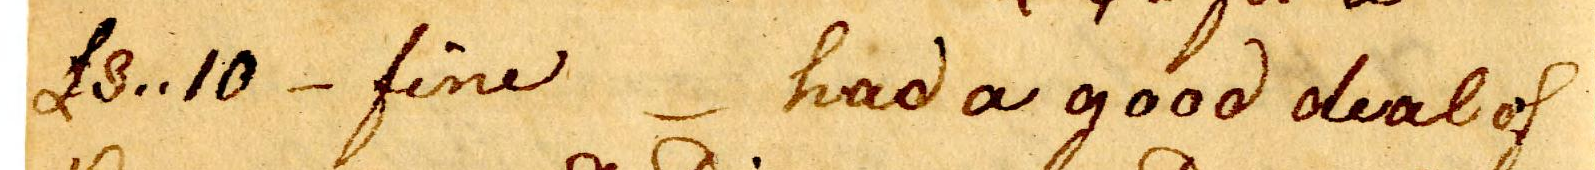3.. 10 sterlings - fine- had a good deal of
